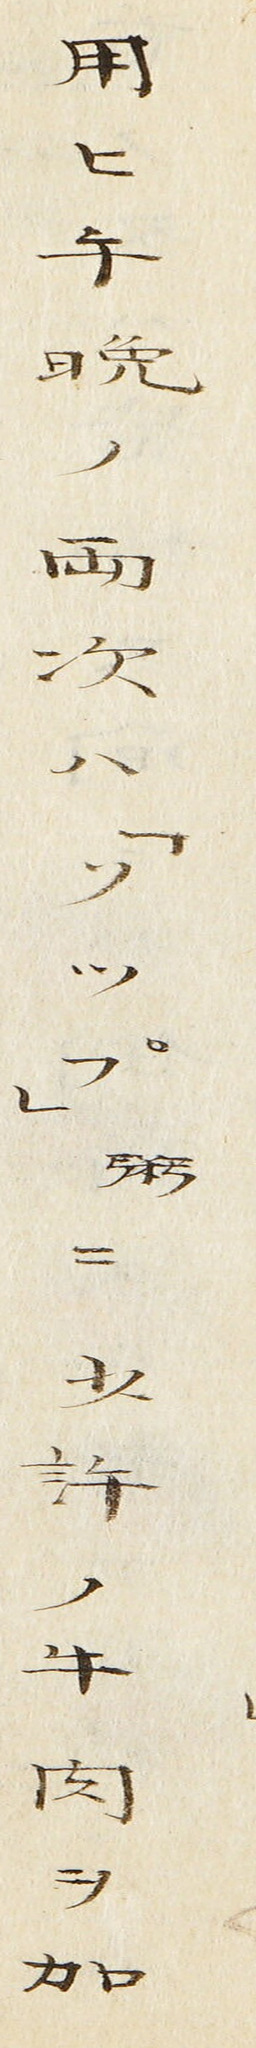用ヒ午晩ノ両次ハ「ソツプ」粥ニ少許ノ牛肉ヲ加
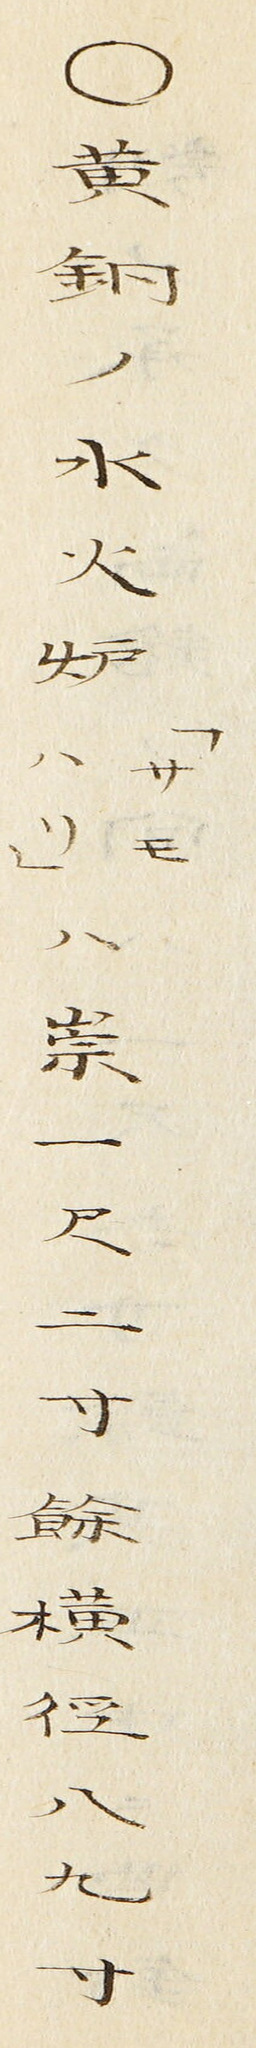〇黄銅ノ水火炉「サモハリ」ハ崇一尺二寸余横径八九寸
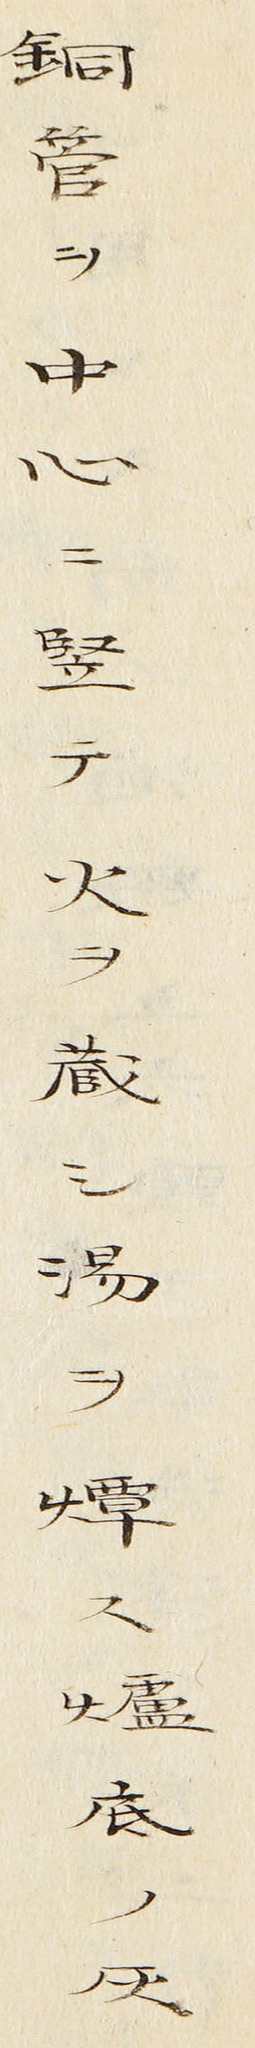銅管ヲ中心ニ竪テ火ヲ蔵シ湯ヲス爐底ノ灰
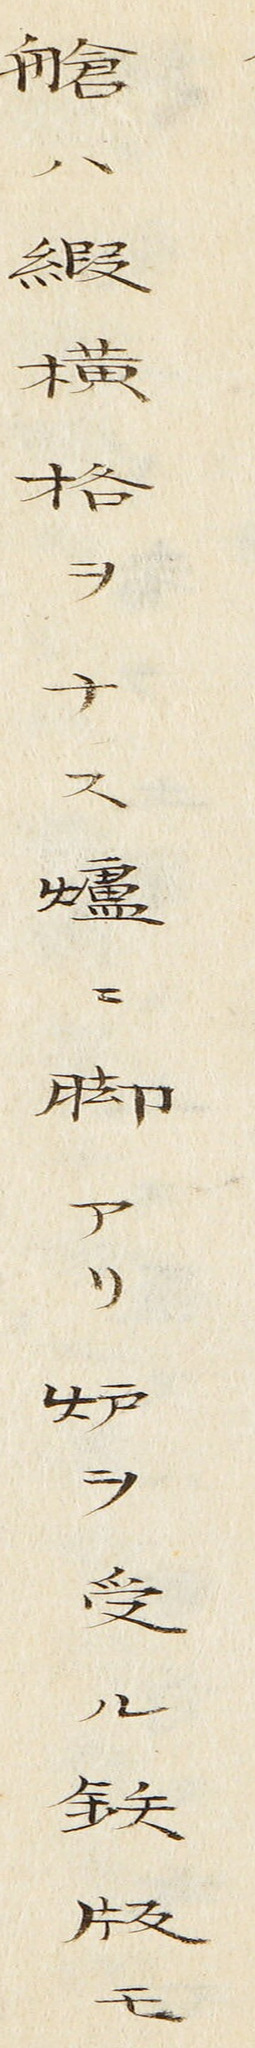艙ハ縀横格ヲナス爐ニ脚アリ炉ヲ受ル鉄版モ
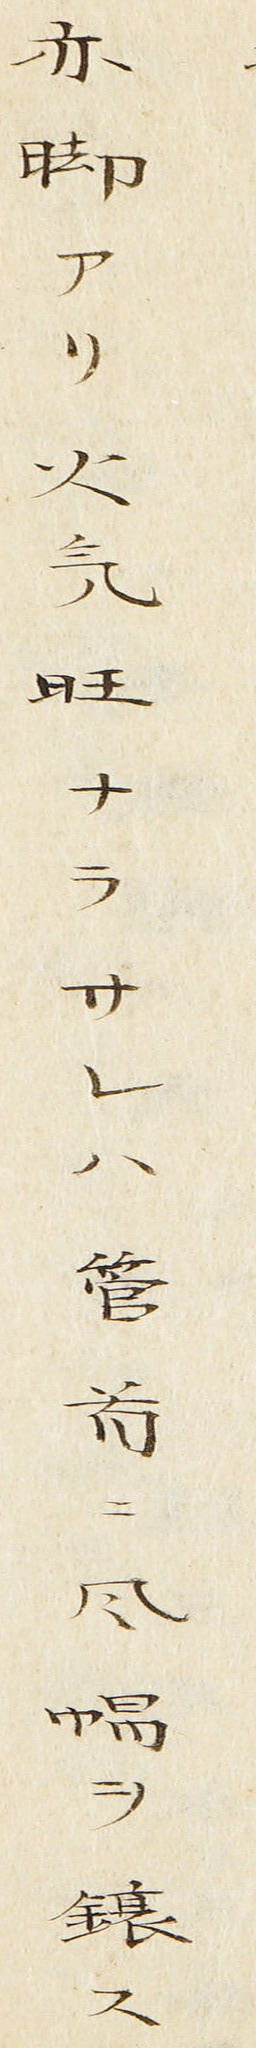亦脚アリ火気旺ナラサレハ管首ニ風帽ヲ鑲？ス
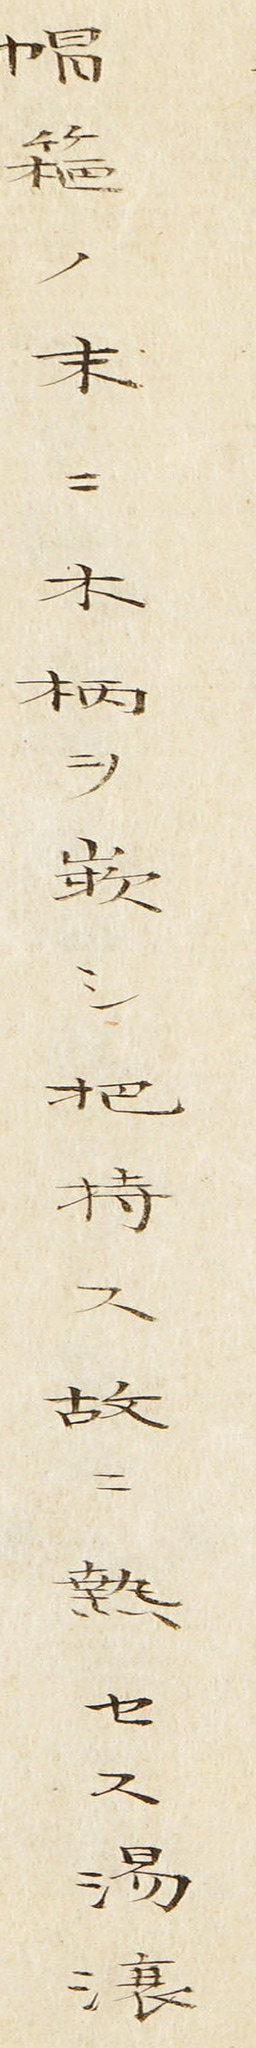帽ノ末ニ木柄ヲ嵌シ把持ス故ニ熱セス湯瀼？
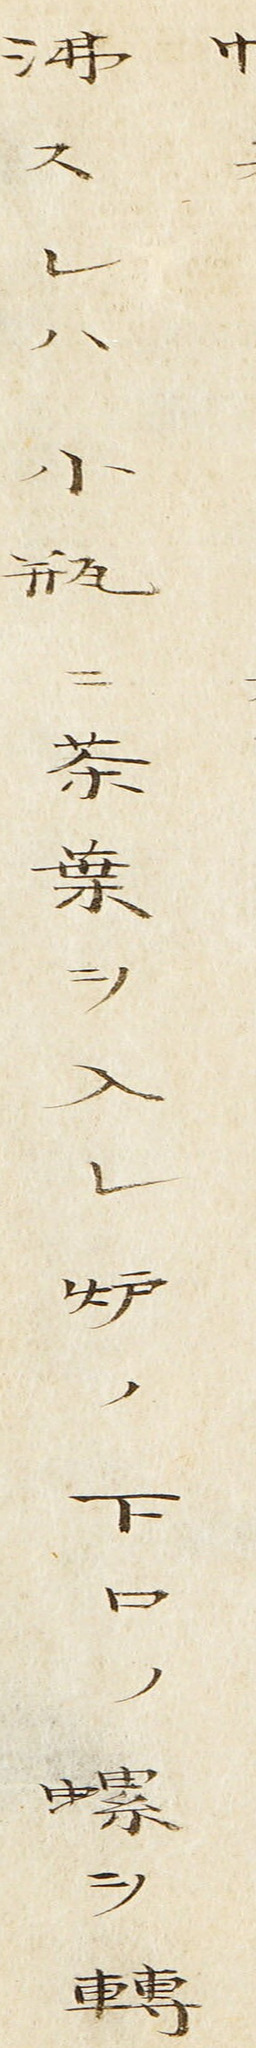沸スレハ小瓶ニ茶葉ヲ入レ炉ノ下口ノ螺ヲ転
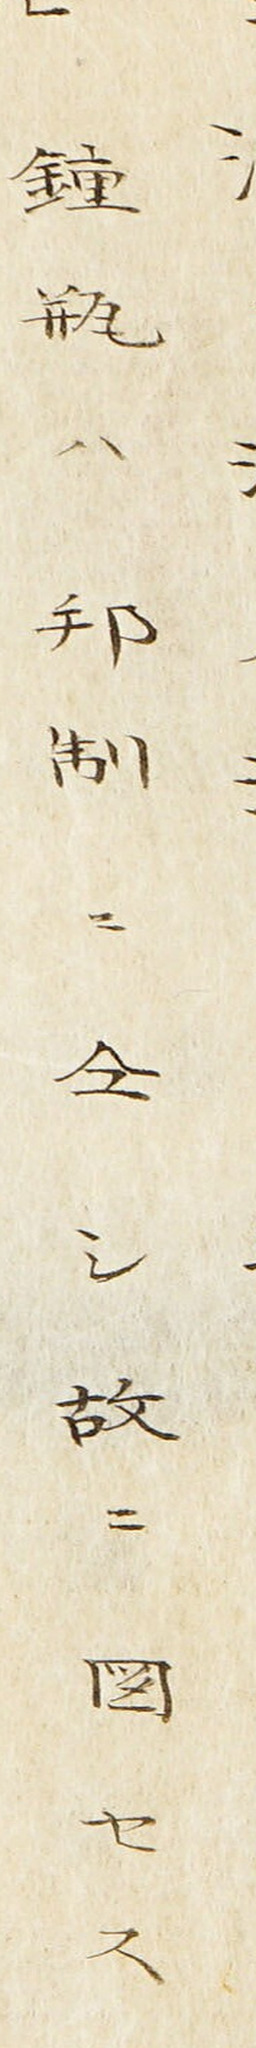ル鐘瓶ハ邦制ニ仝シ故ニ図セス

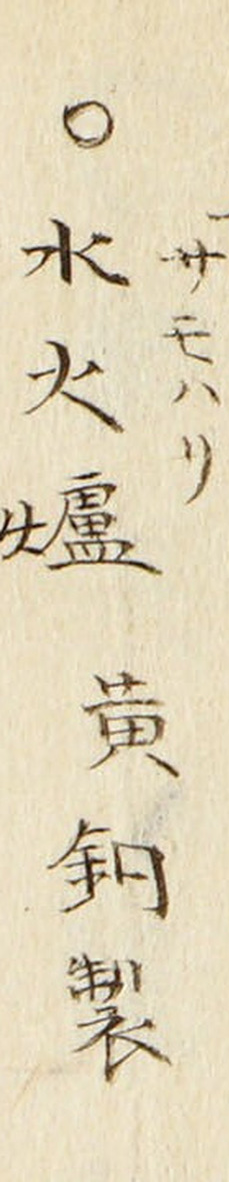〇水火爐黄銅製
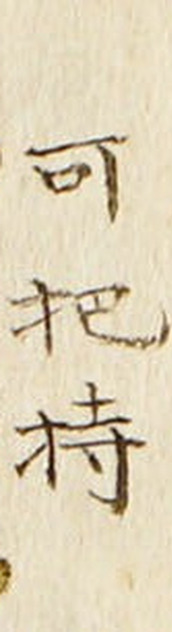可把持
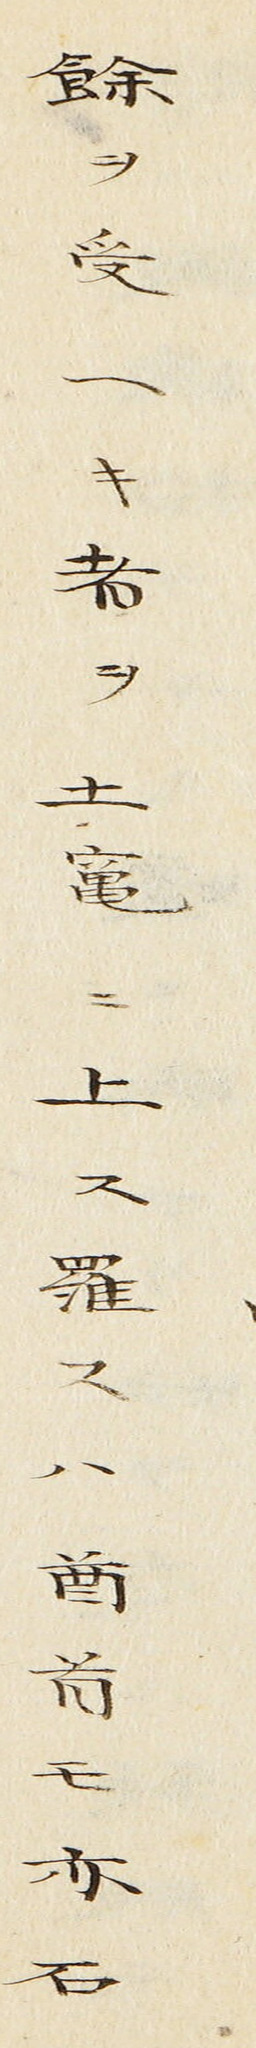余ヲ受ヘキ者ヲ土竃ニ上ス羅スハ酋首モ亦石
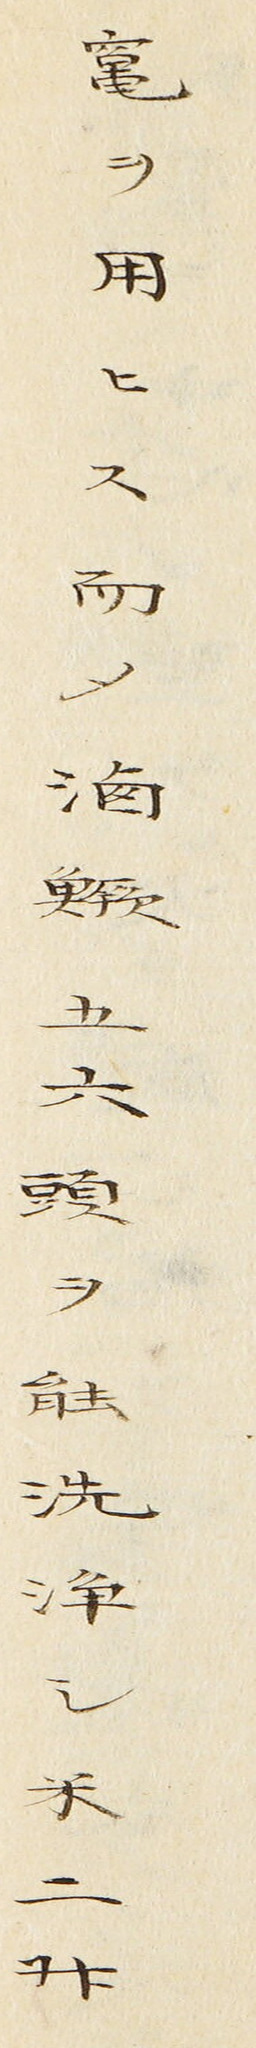竃ヲ用ヒス而シテ滷鱖五六頭ヲ能洗浄シ米二升
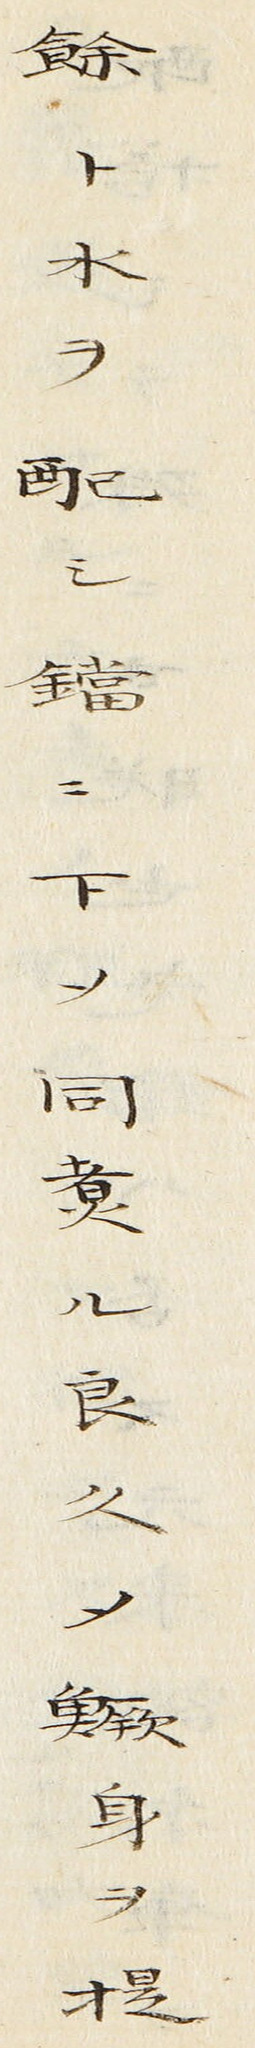余ト水ヲ配シ鐺ニ下シテ同煮ル良久シテ鱖身ヲ提
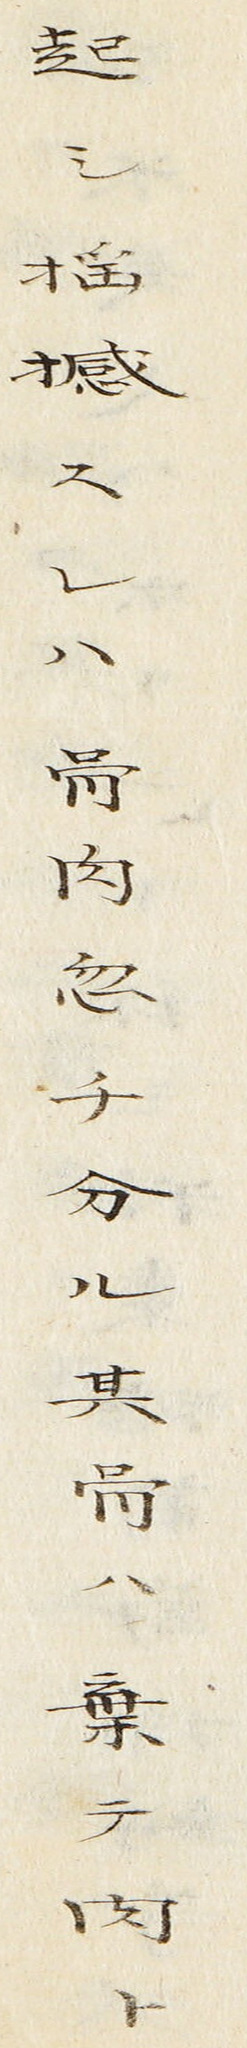起シ揺撼スレハ骨肉忽チ分ル其骨ハ棄テ肉ト
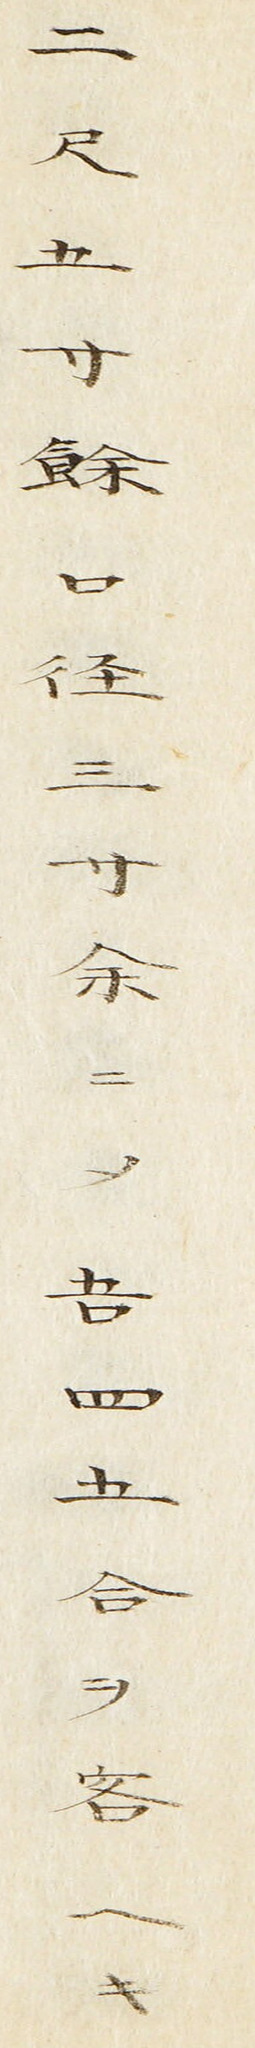二尺五寸余口径三寸余ニシテ吾四五合ヲ客ヘキ
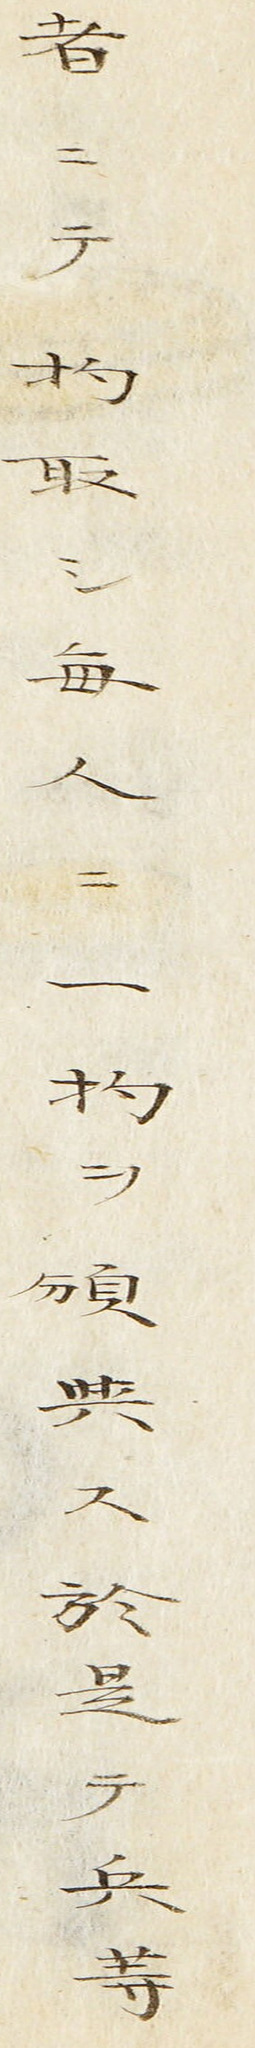者ニテ杓取シ毎人ニ一杓ヲ頒与ス於是テ兵等
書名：蕃談
